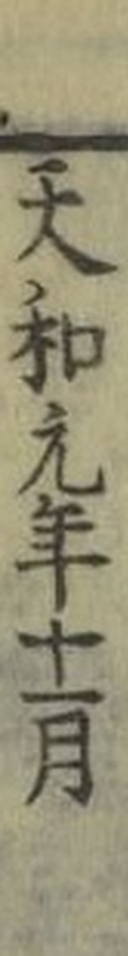天和元年十一月同
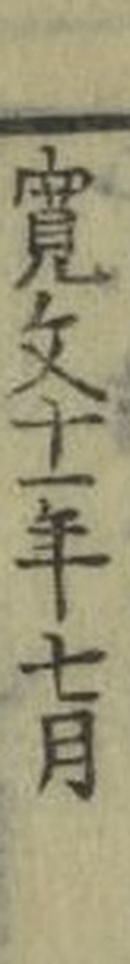寛文十一年七月同
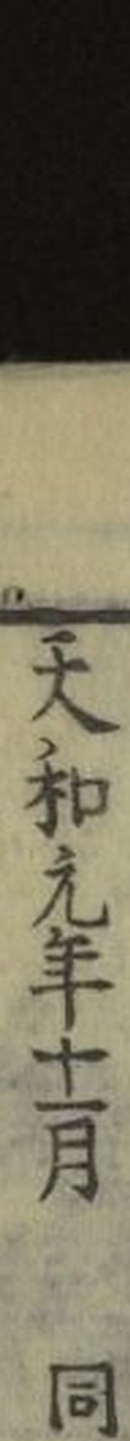天和元年十一月同
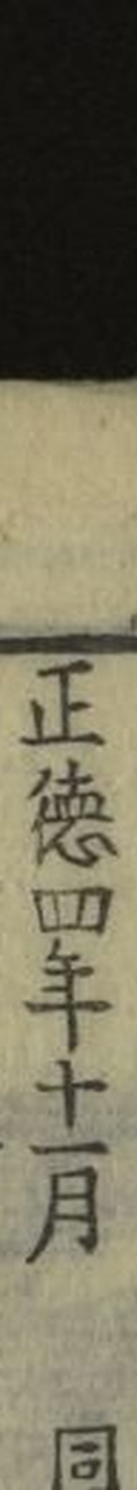正徳四年十一月同
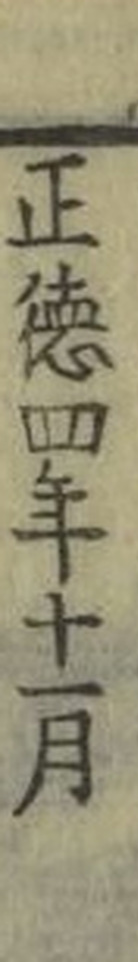正徳四年十一月同
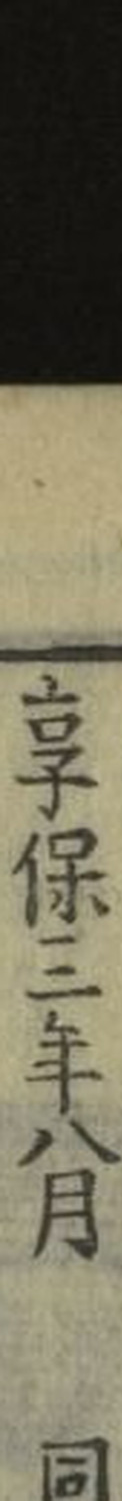享保三年八月同
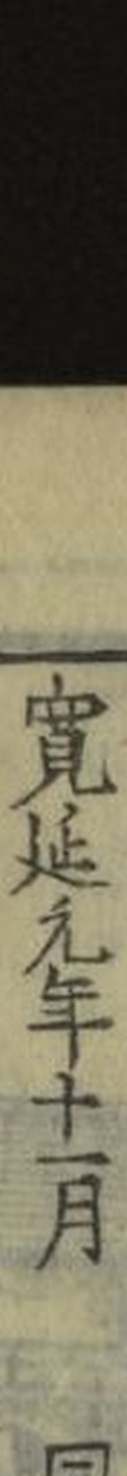寛延元年十一月同
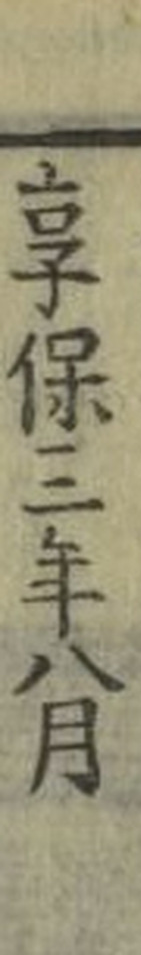享保三年八月同
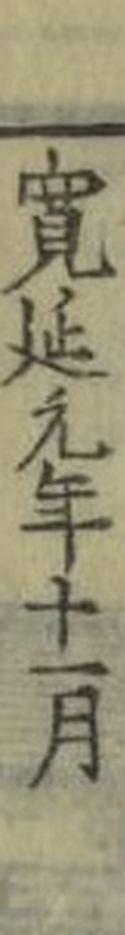寛延元年十一月同
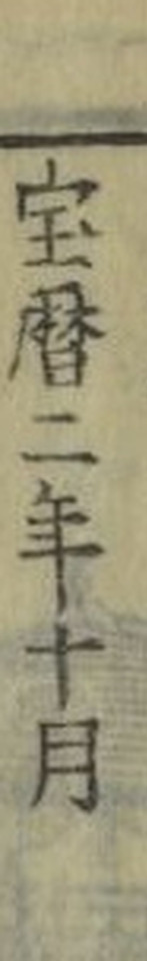宝暦二年十月同
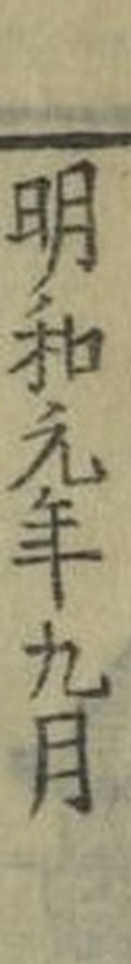明和元年九月同
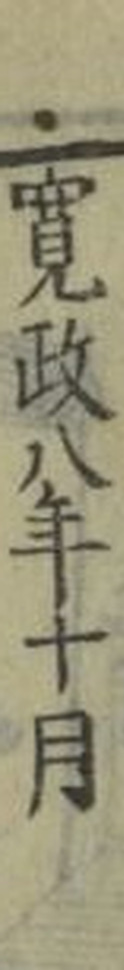寛政八年十月同
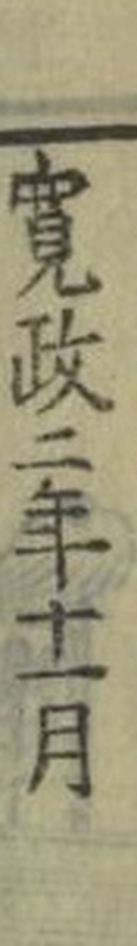寛政二年十一月同
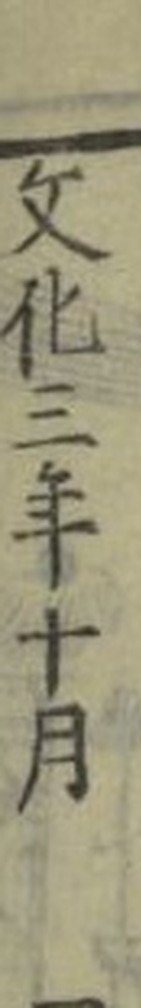文化三年十月同
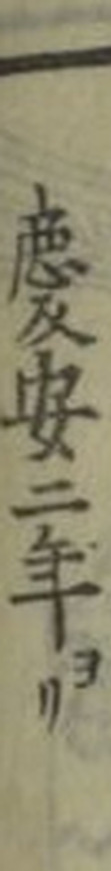慶安二年ヨリ
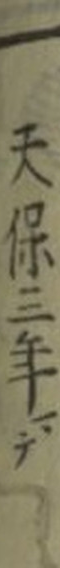天保三年マテ
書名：新板 琉球人行列記
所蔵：University of the Ryukyus Library
